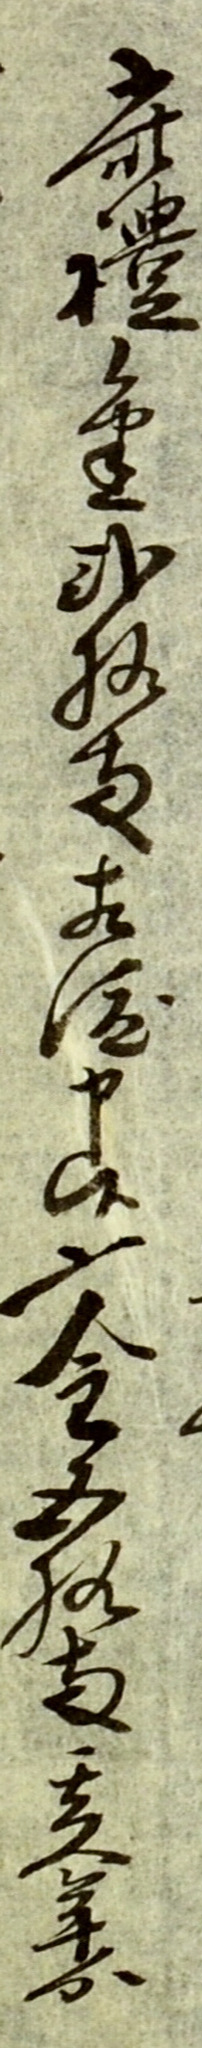此礼金弐拾両相渡申候〆金五拾両亥年ゟ
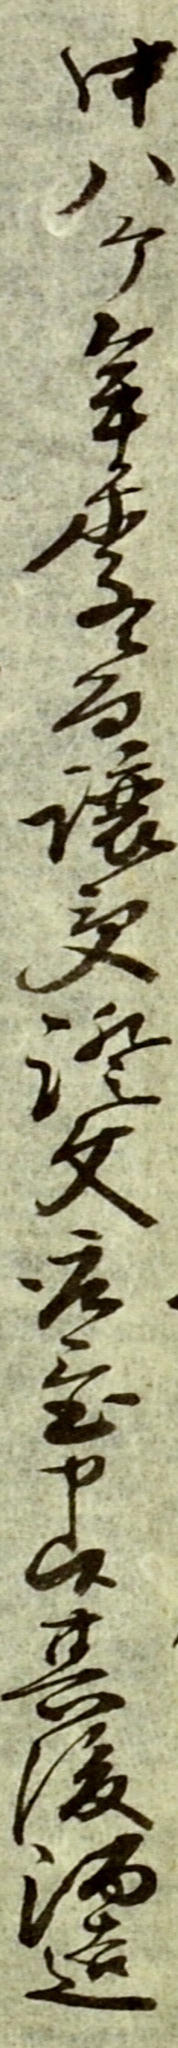申八ケ年季ニ而譲受証文取置申候其後酒造
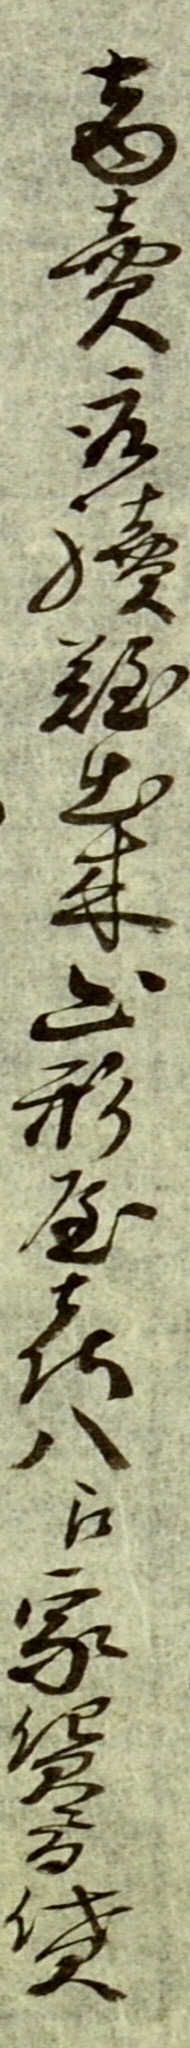商売取続難出来山形屋喜八江家賃ニ而貸
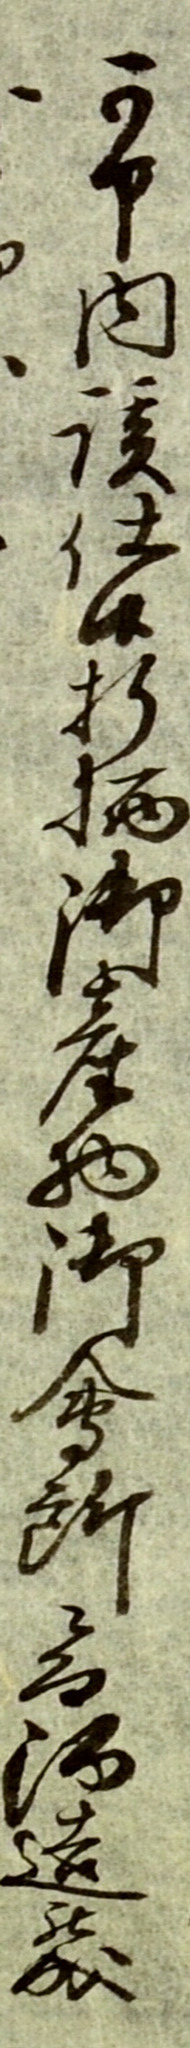可申内談仕候折柄御産物御会所ニ而酒造被成
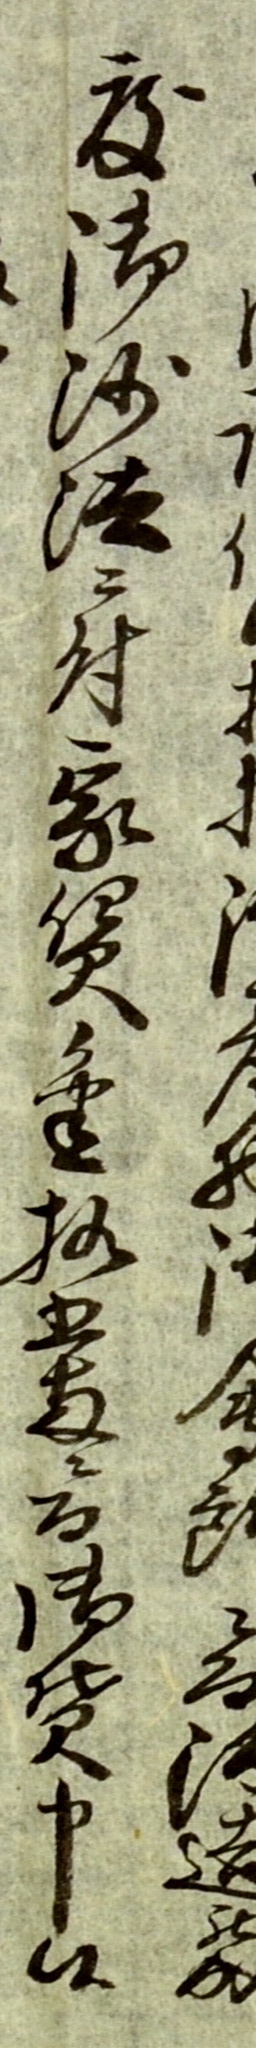度御沙汰ニ付家賃金拾五両ニ而御貸申候
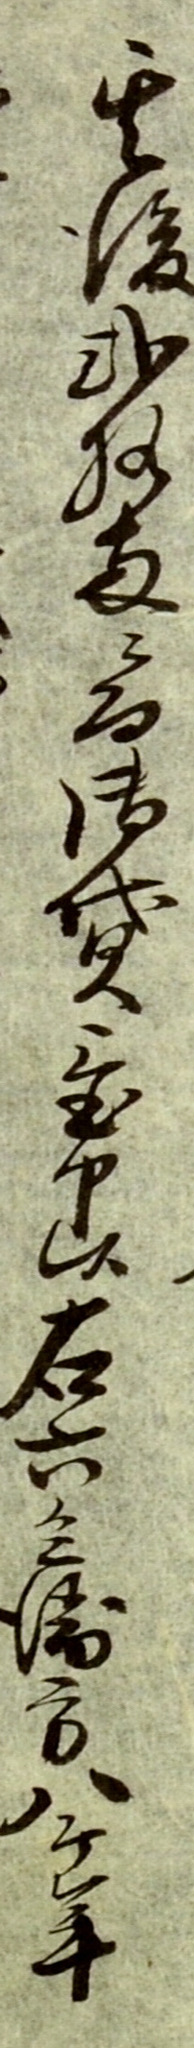其後弐拾両ニ而御貸置申候右六兵衛方八ケ年
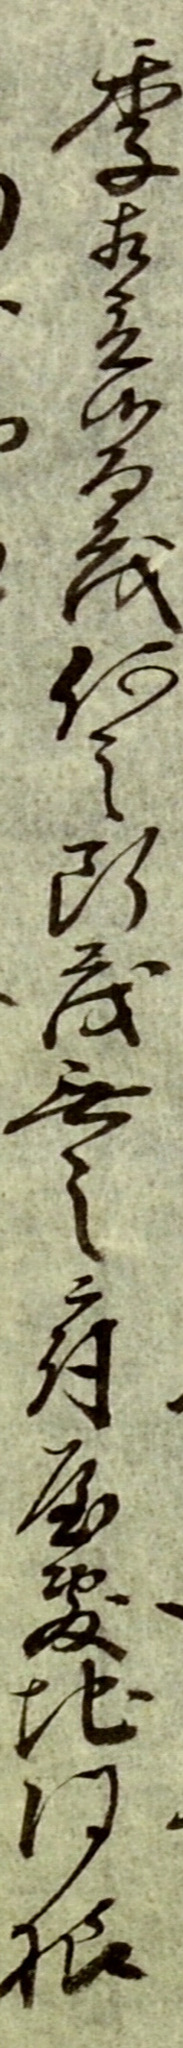季相立候而茂何之断茂無之ニ付屋敷地同様
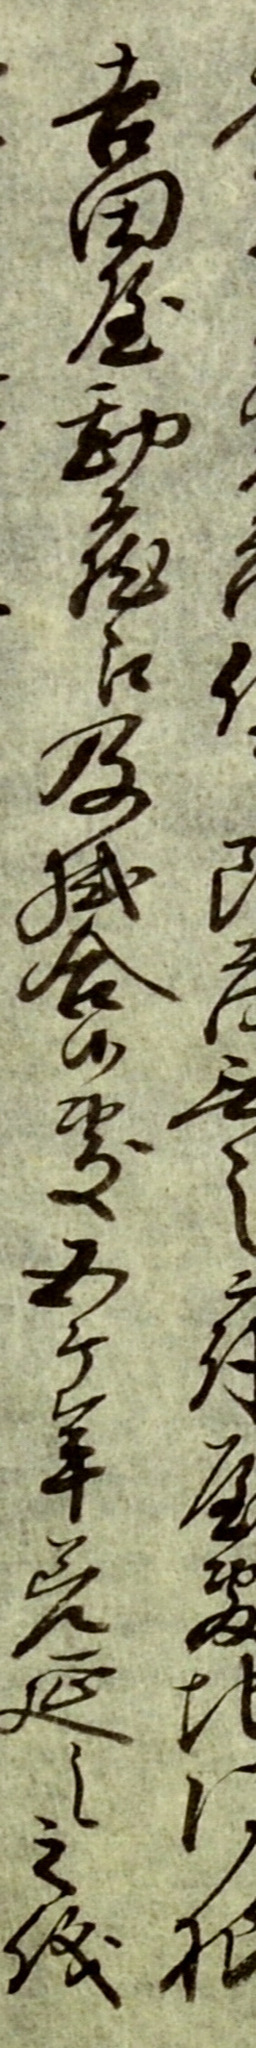吉田屋勘蔵江及掛合候処五ケ年差延し之儀
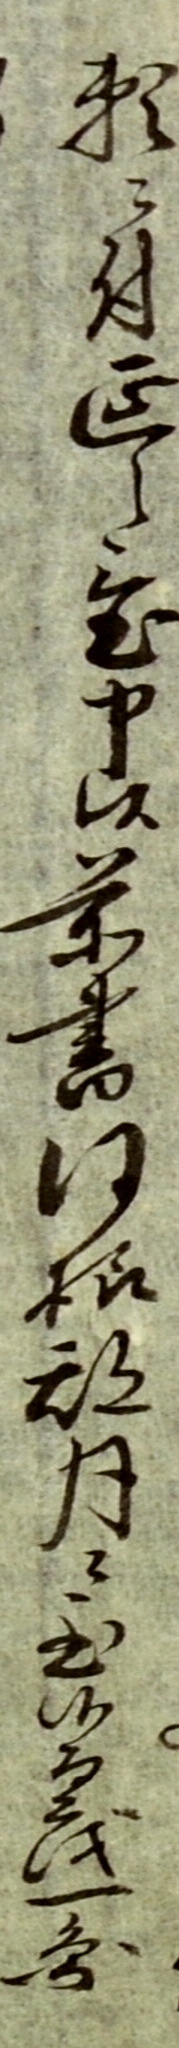願ニ付延し置申候前書同様期月ニ至候而茂一円
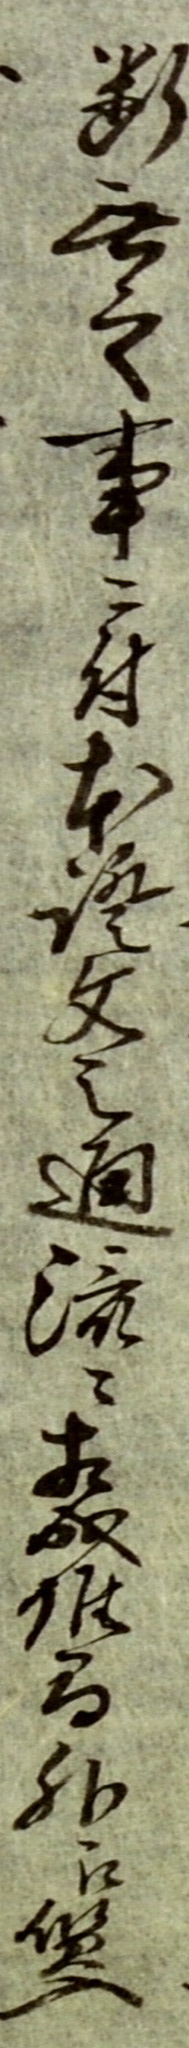断無之事ニ付本証文之通流ニ相成候間外江質入
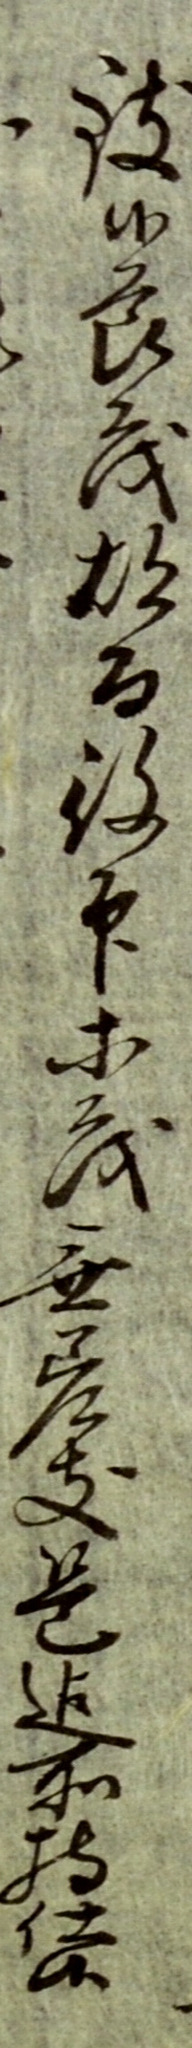致候節茂都而役印等茂無差支是迄所持仕候
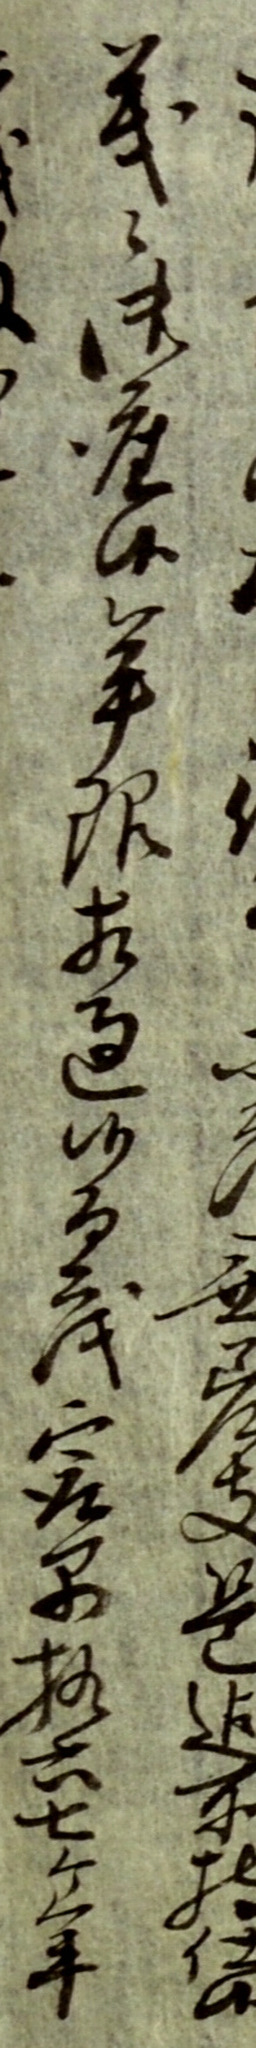義ニ御座候年限相過候而茂最早拾六七ケ年
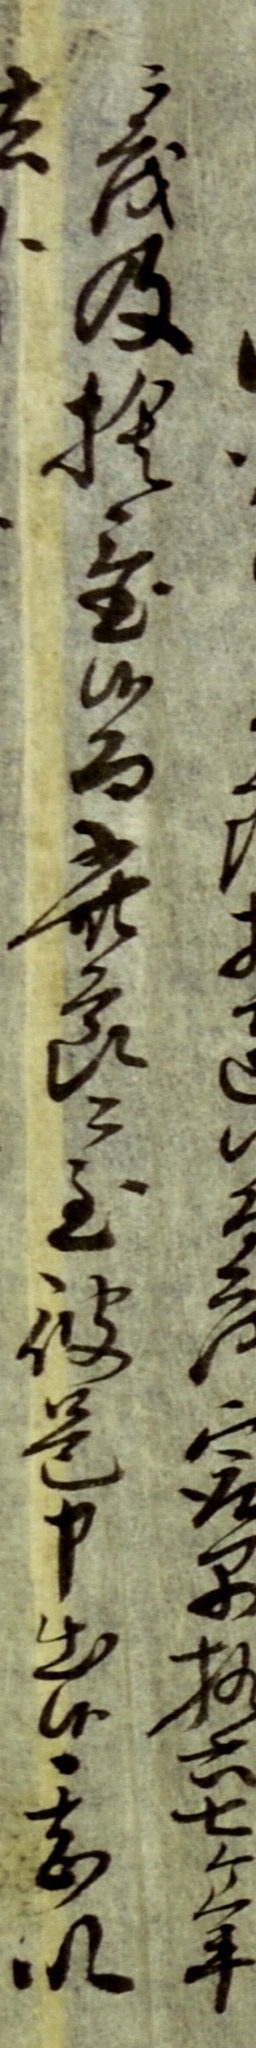ニ茂及捨置候而此節ニ至彼是申出候甚以
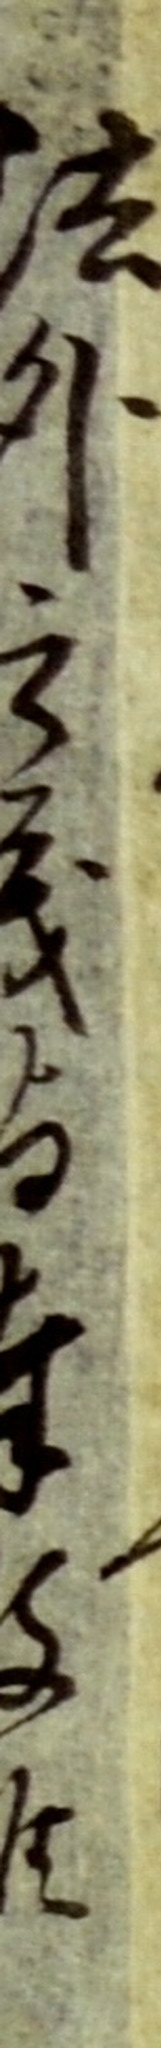法外之義と奉存候

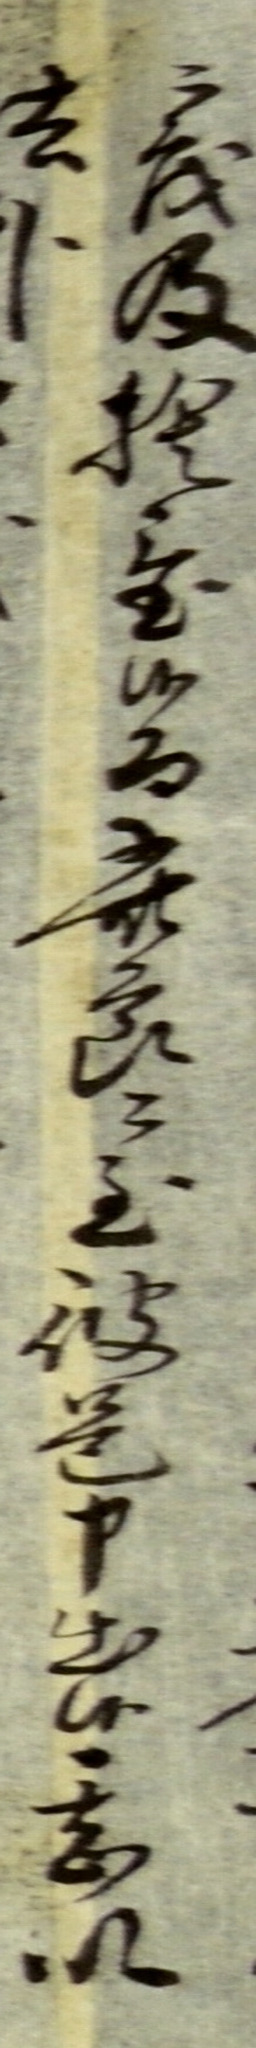ニ茂及捨置候而此節ニ至彼是申出候甚以
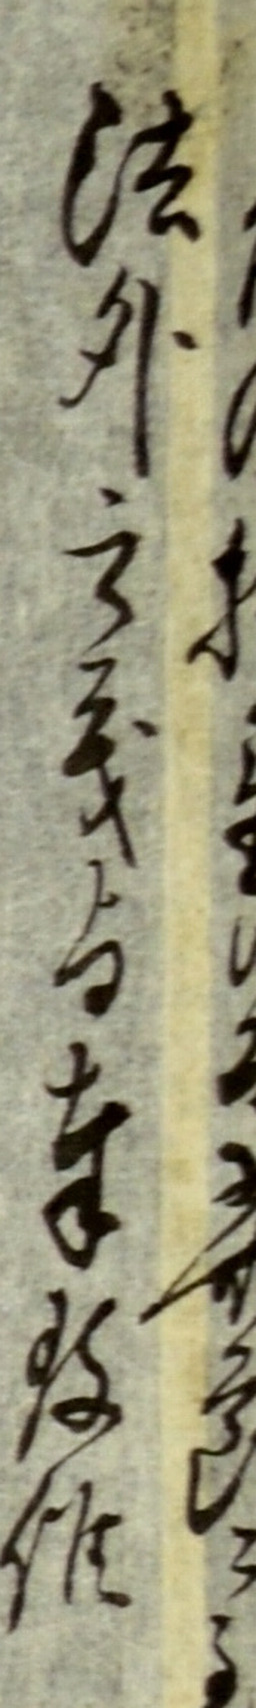法外之義と奉存候
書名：乍恐以口上書奉申上候御事
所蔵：伊那市立高遠町図書館・合同会社AMANE
